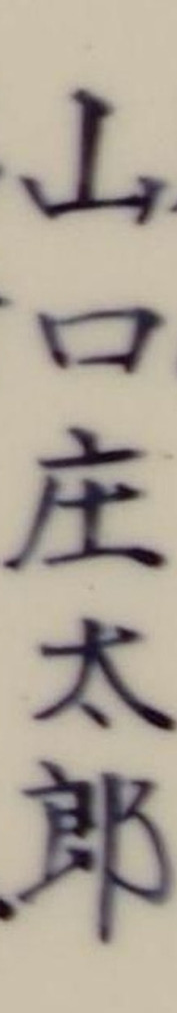山口庄太郎
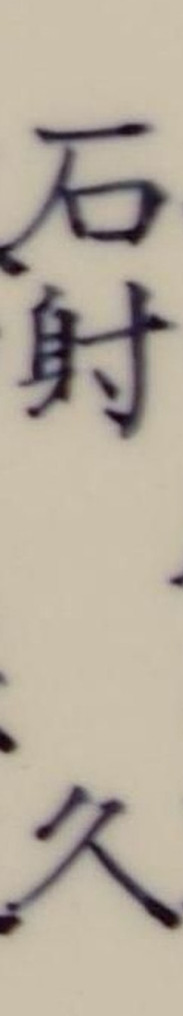石射久
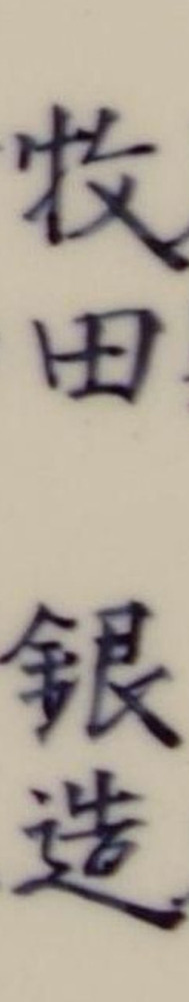牧田銀造
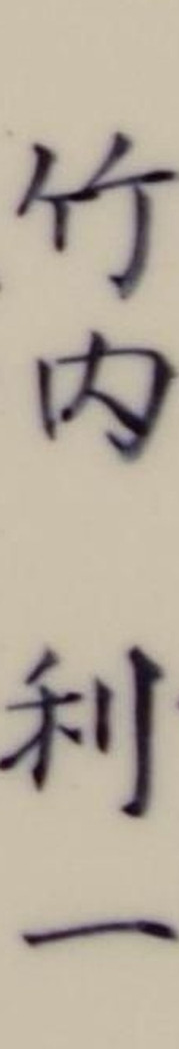竹内利一
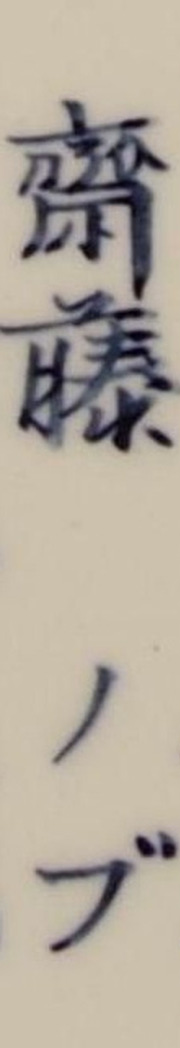斎藤ノブ
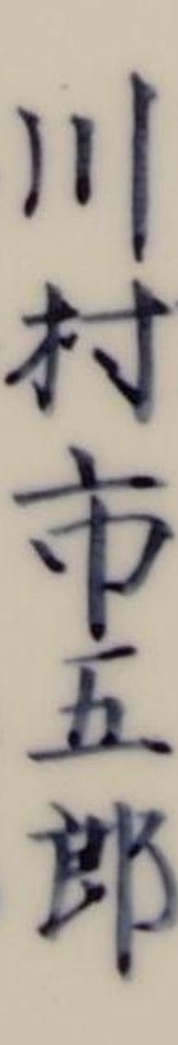川村市五郎
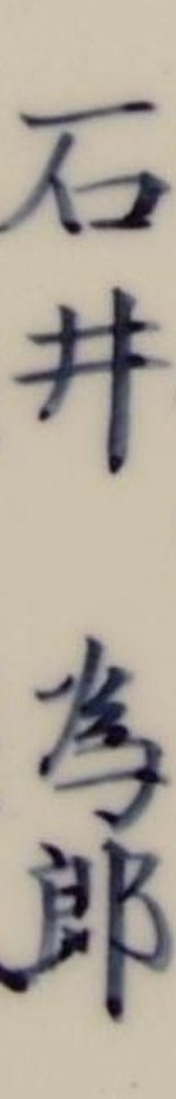石井為郎
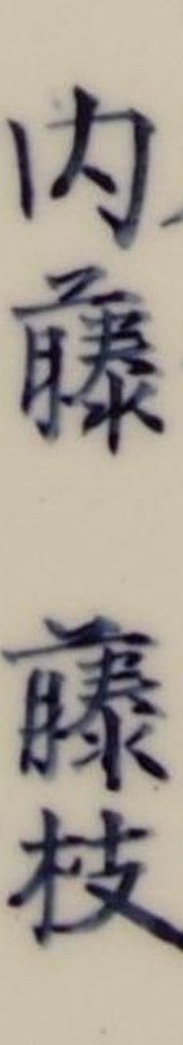内藤藤枝
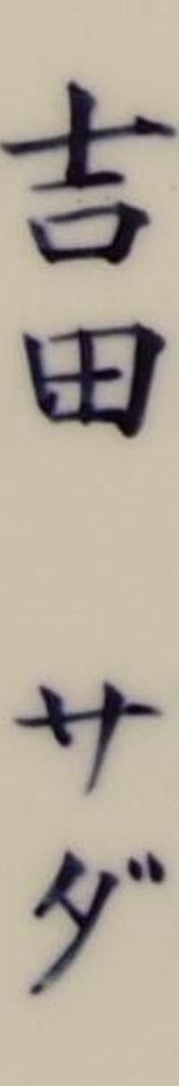吉田サダ
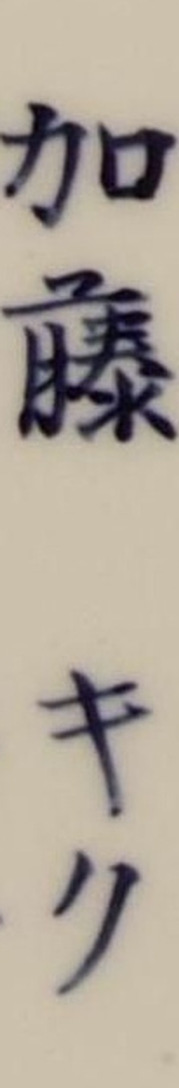加藤キク
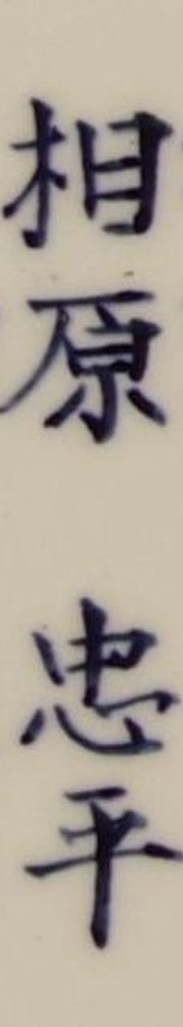相原忠平
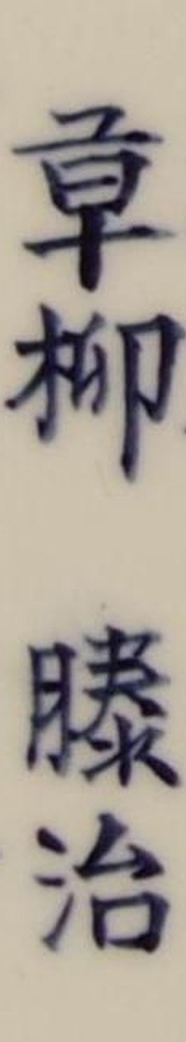草柳膝治
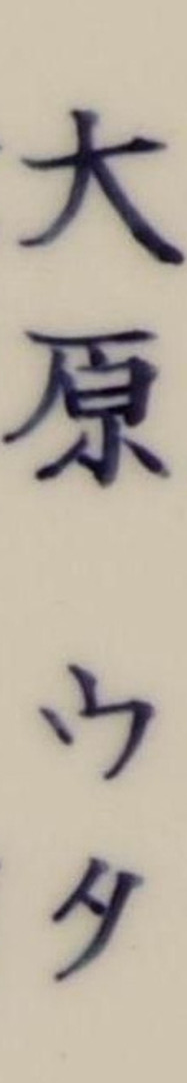大原ウタ

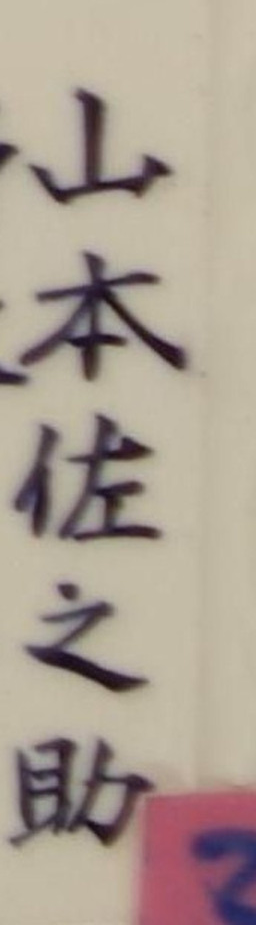山本佐之助
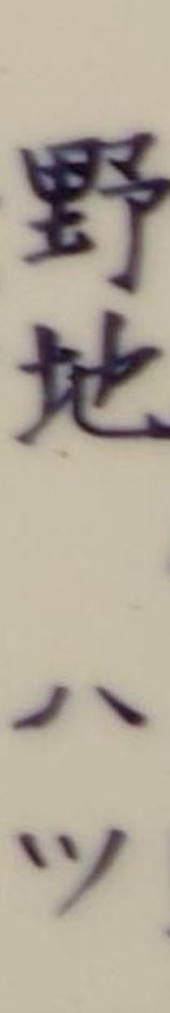野地ハツ
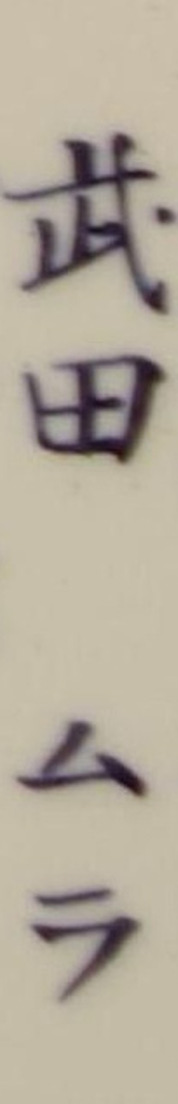武田ムラ
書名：M~S
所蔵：高野山金剛峯寺
